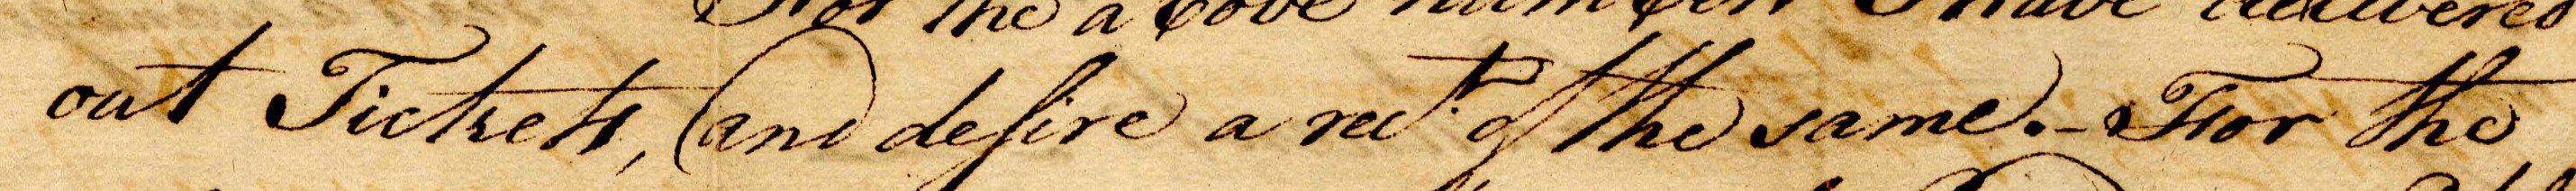oat Tichets tend desse are o the smet Tor the
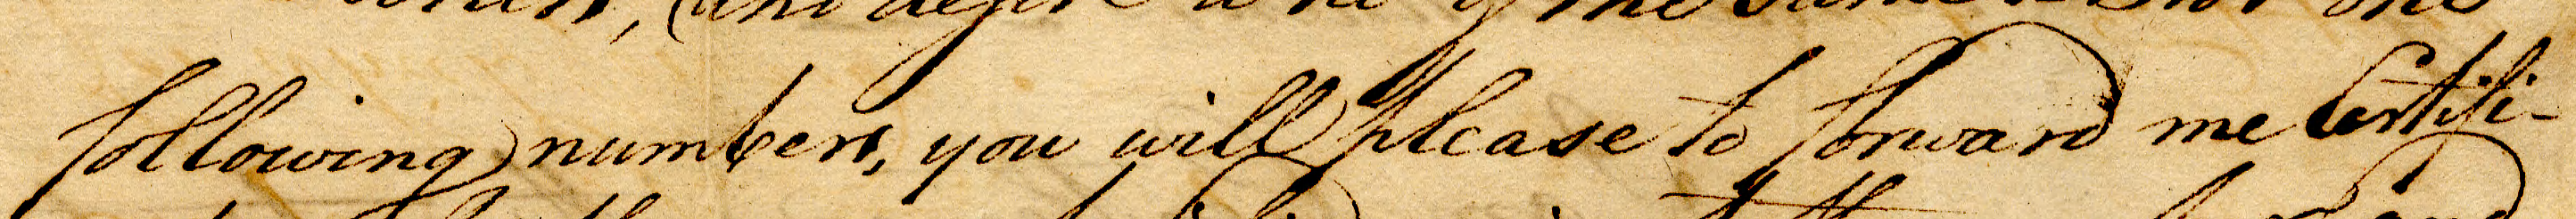pllowvingmnumters you will pease to sard me tert
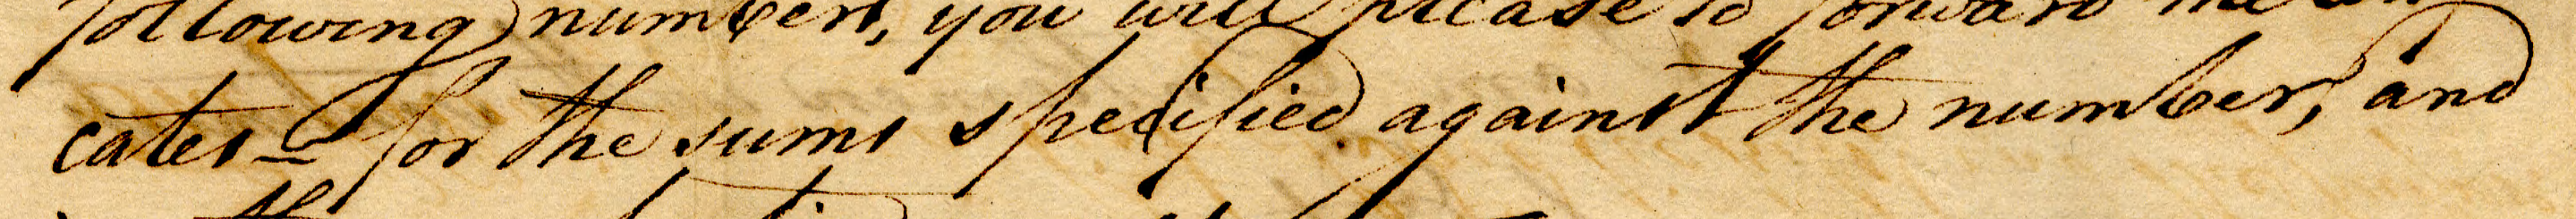coles Pfor the sams sssebeled arainst he number and
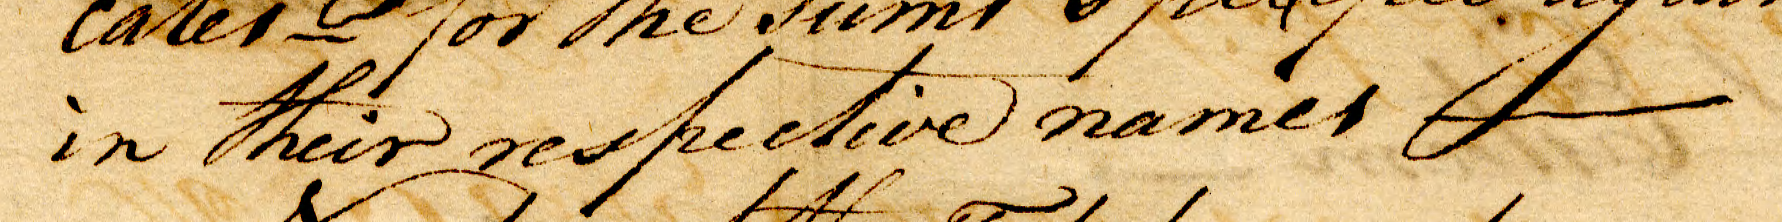in theis wopechive oumet ih
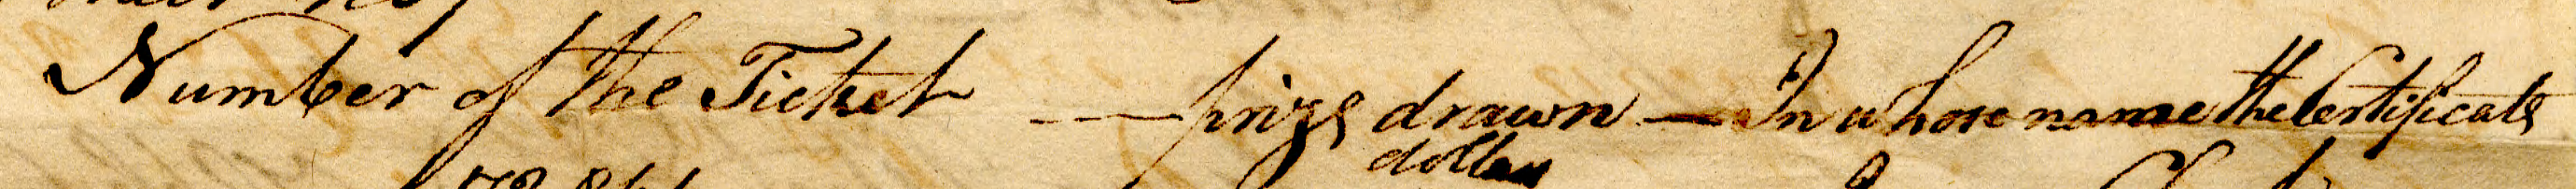Manbes of the Tckct hoyedown erhaemncke sfat
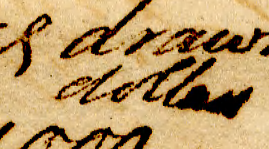Rell
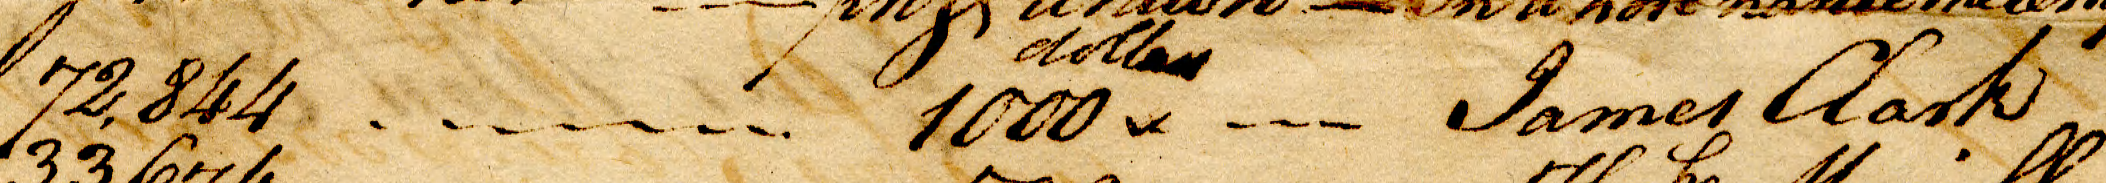10384--- 000 Tames blark
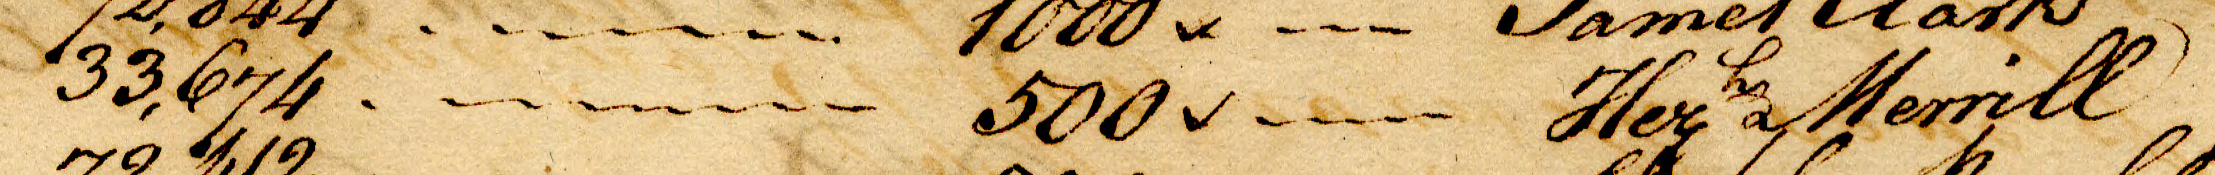33674--- 500 -- Her omll
